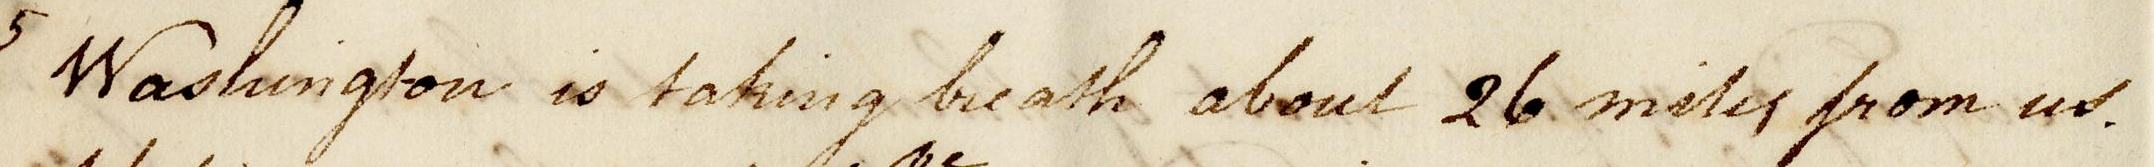Washington is taking breath about 26 miles from us.
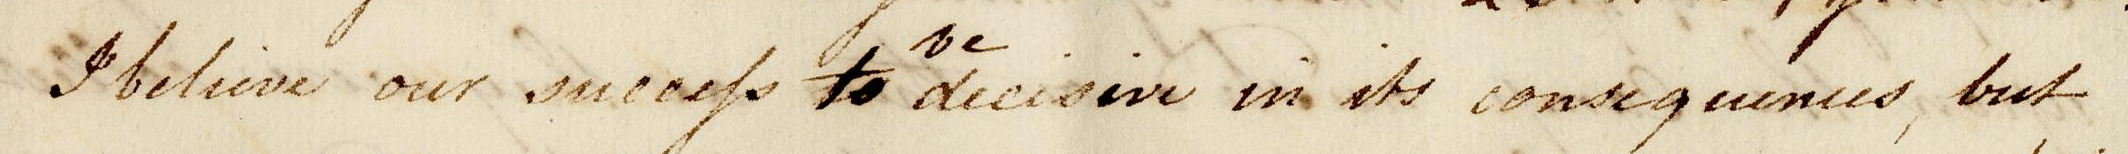I believe our success to decisive in its consequences, but
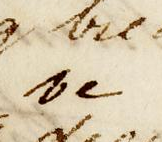be
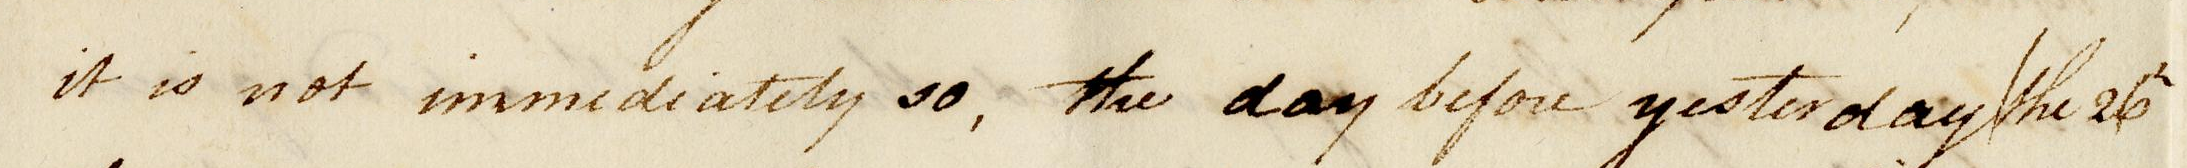it is not immediately so, the day before yesterday (the 26^h
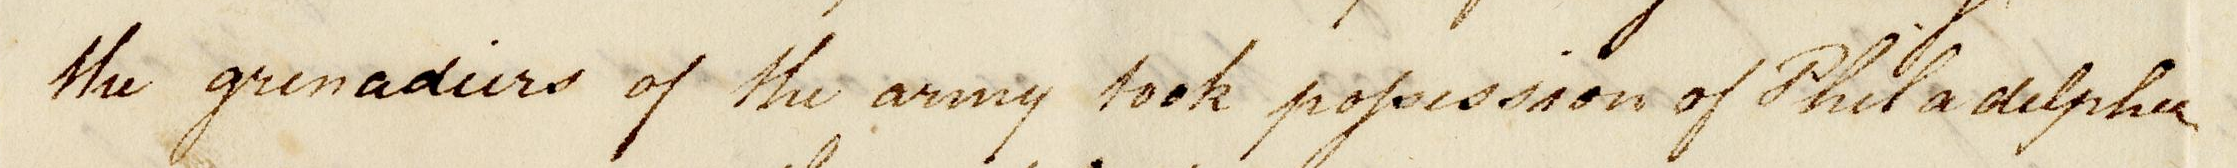the grenadiers of the army took posession of Philadelphia
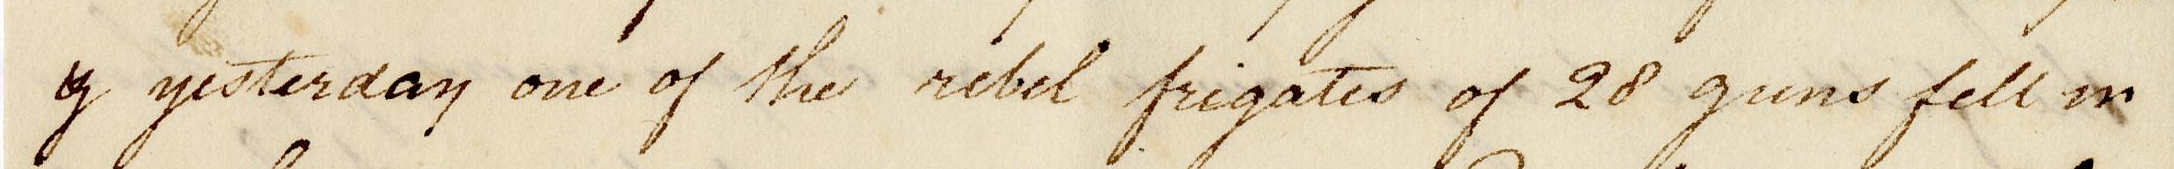& yesterday one of the rebel frigates of 28 guns fell in
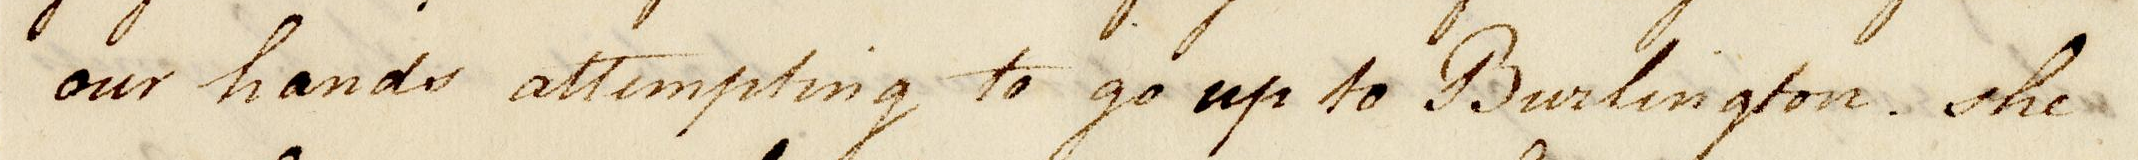our hands attempting to go up to Burlington. she
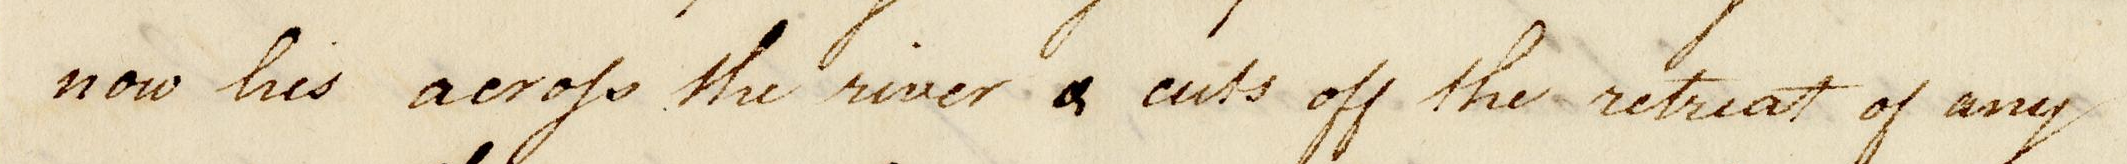now his across the river & cuts off the retreat of any
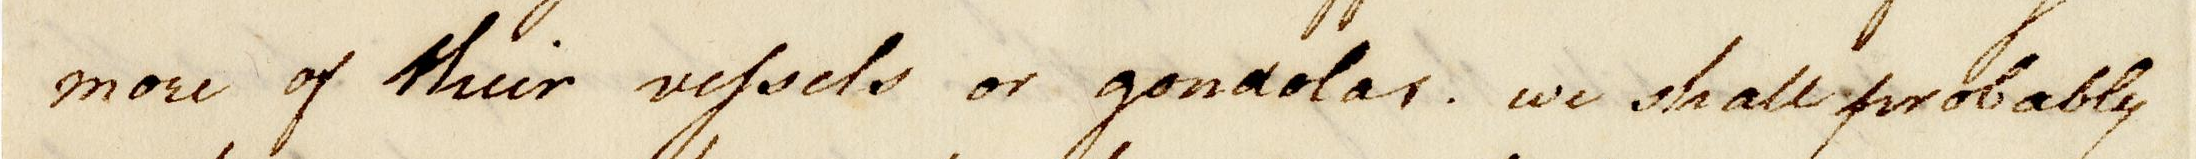more of their vessels or gondolas. we shall probably
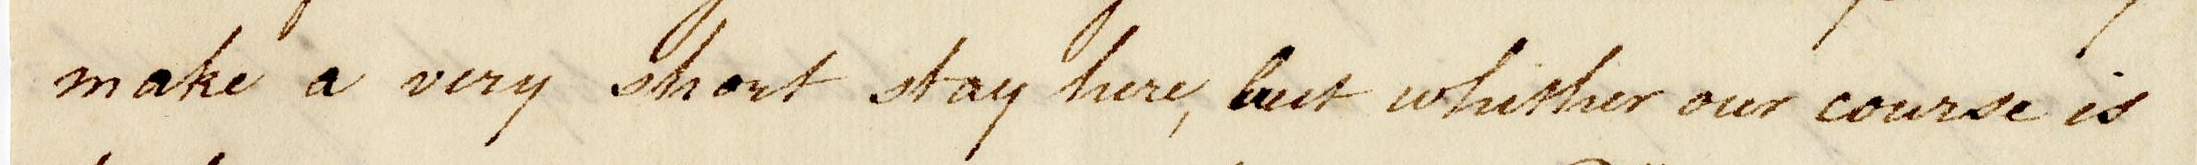make a very short stay here, but whither our course is
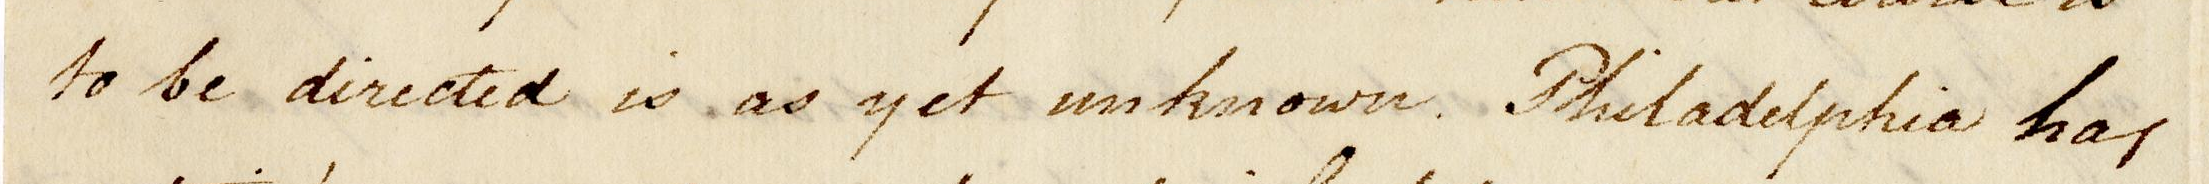to be directed is as yet unknown. Philadelphia has
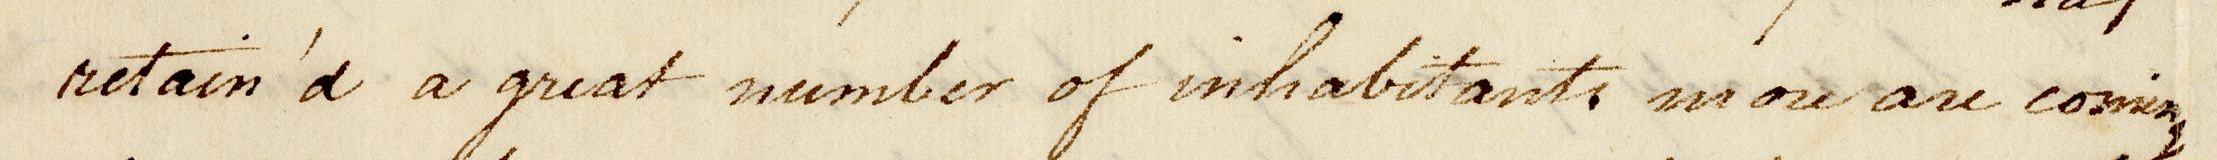retain'd a great number of inhabitants more are coming
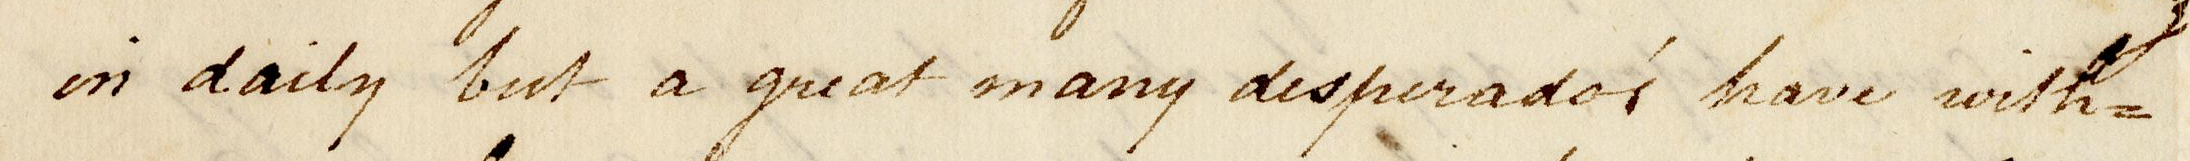in daily but a great many desperados have with-
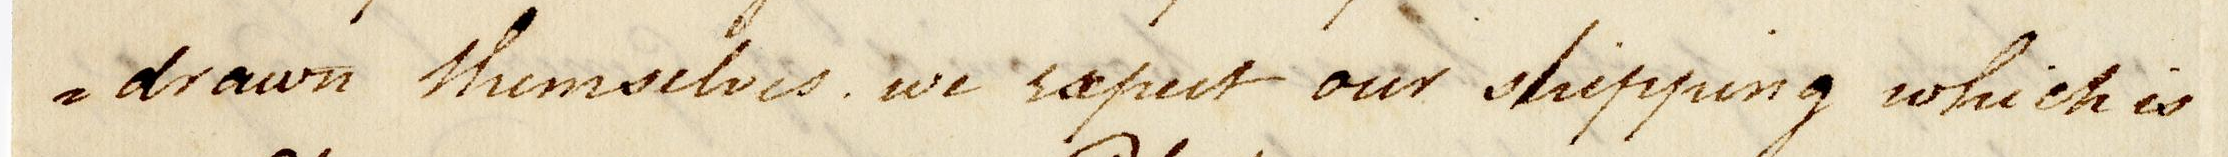-drawn themselves. we expect our shipping which is
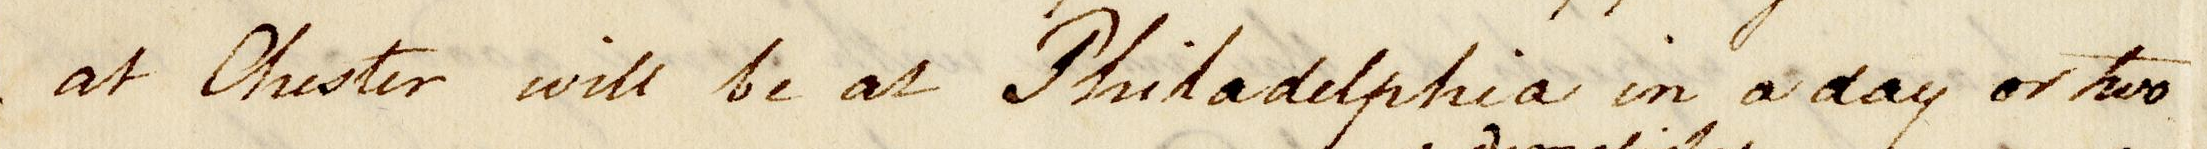at Chester will be at Philadelphia in a day or two
